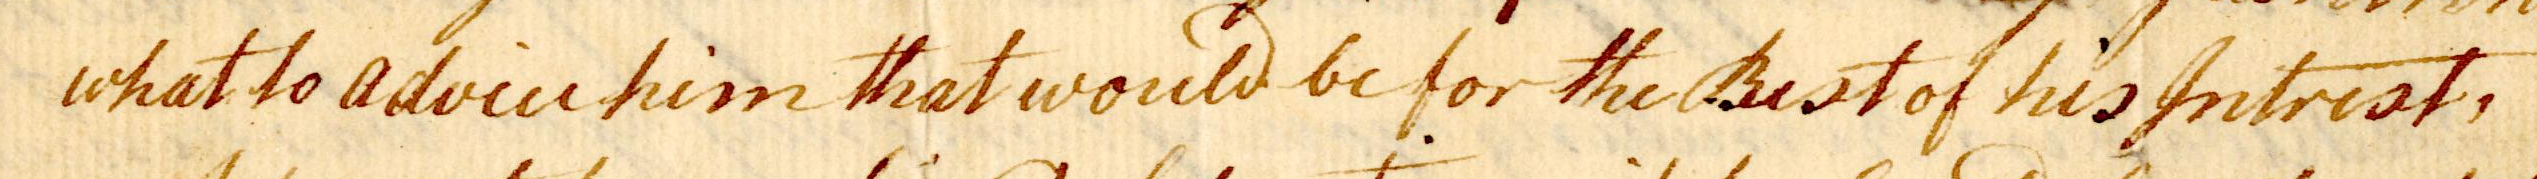what to advice him that would be for the Rest of his Intrest.
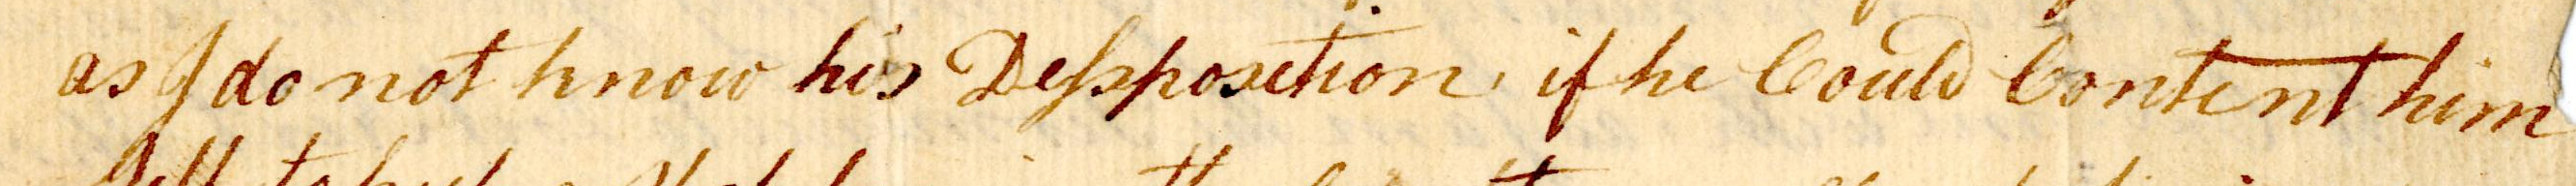as I do not know his Dessposition if he Could Content him
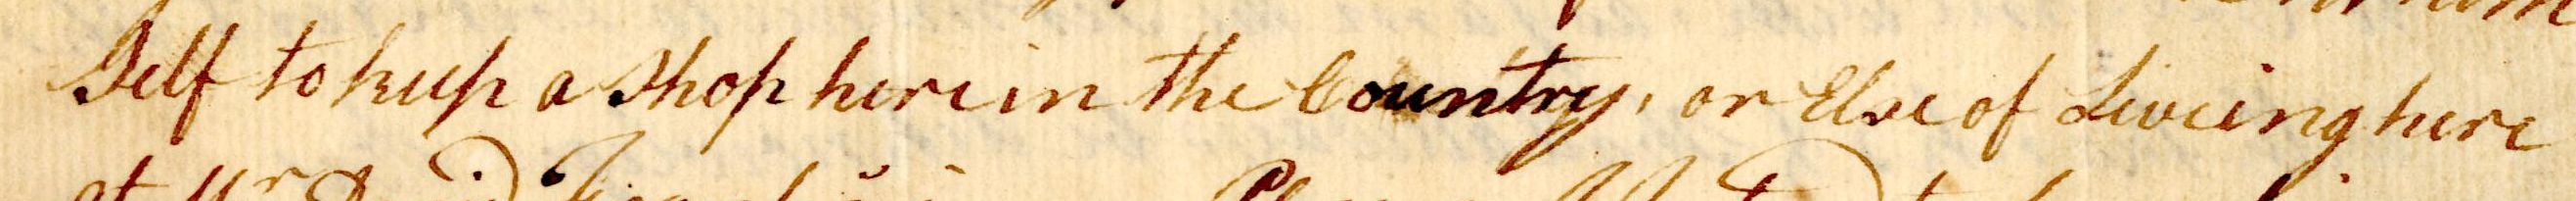self to keep a shop here in the Country, or Else of Living here
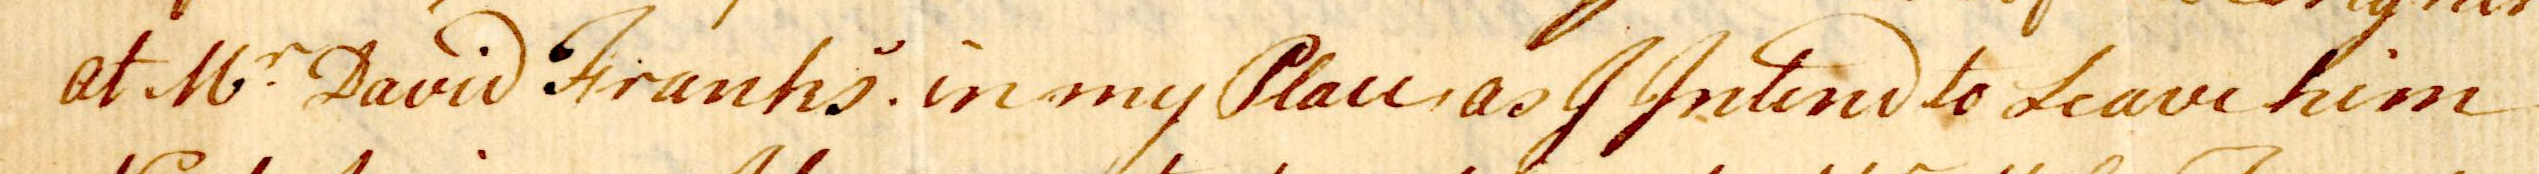at M^r. David Franks in my Place as I Intend to Leave him
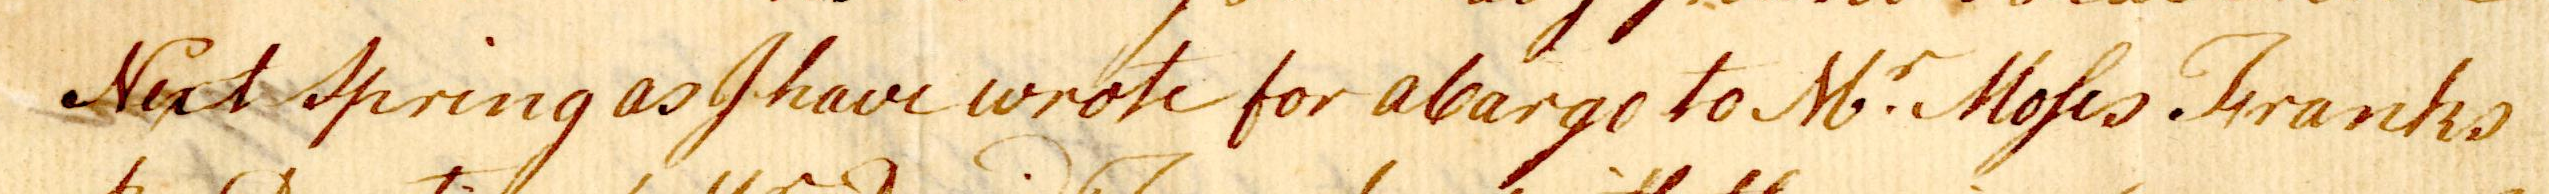Next spring as I have wrote for a Cargo to M^r. Moses Franks
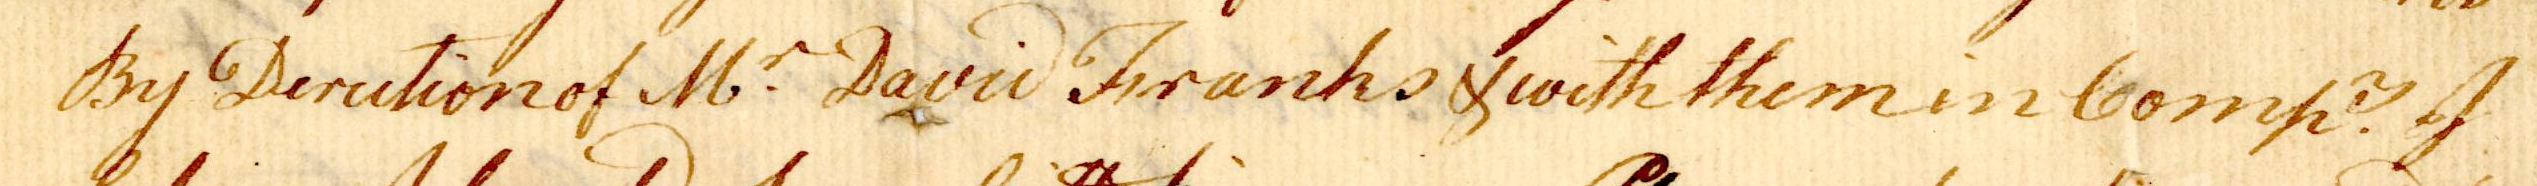By Direction of M^r. David Franks & with them in Comp^y. if
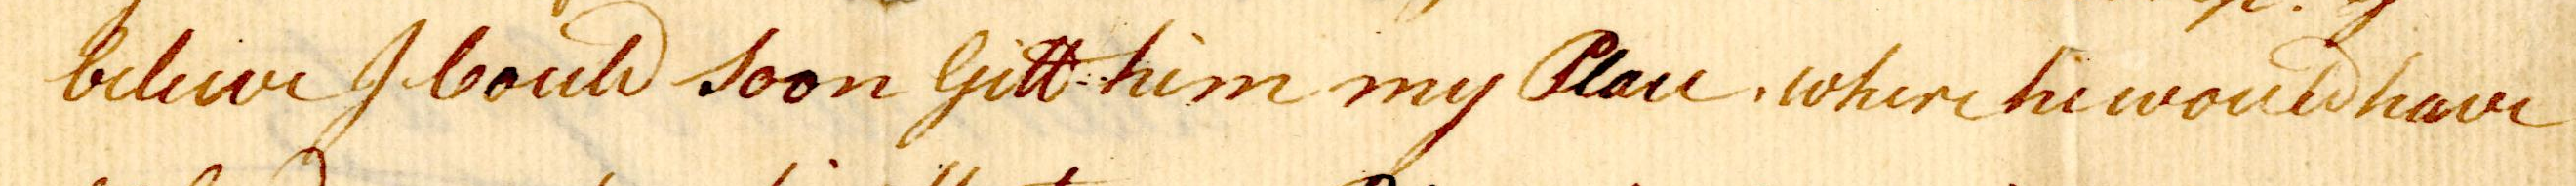believe I Could Soon Gitt him my place where he would have
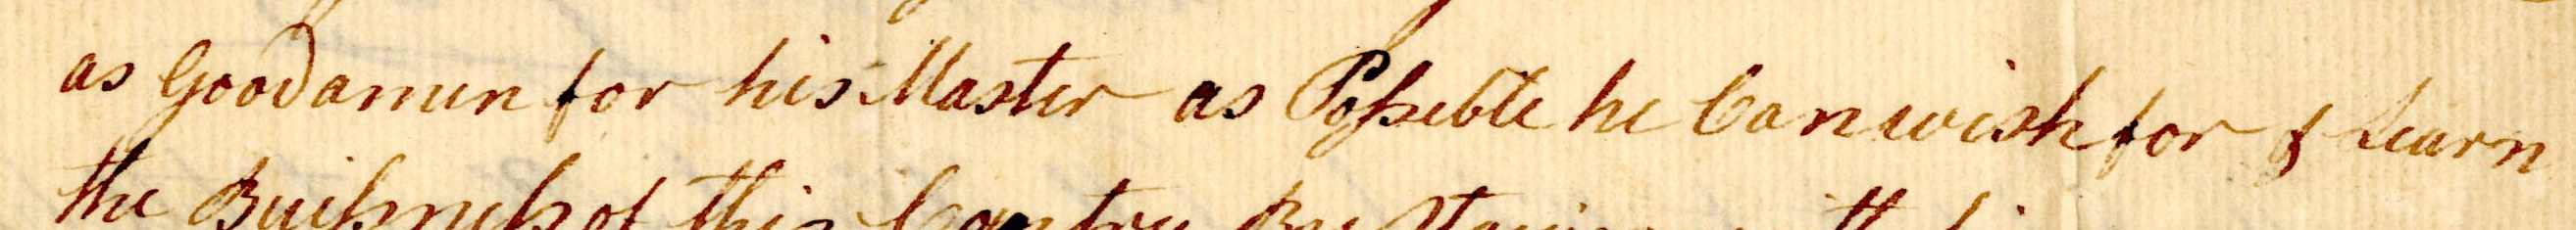as Good a man for his Master as Possible he Can wish for & Learn
